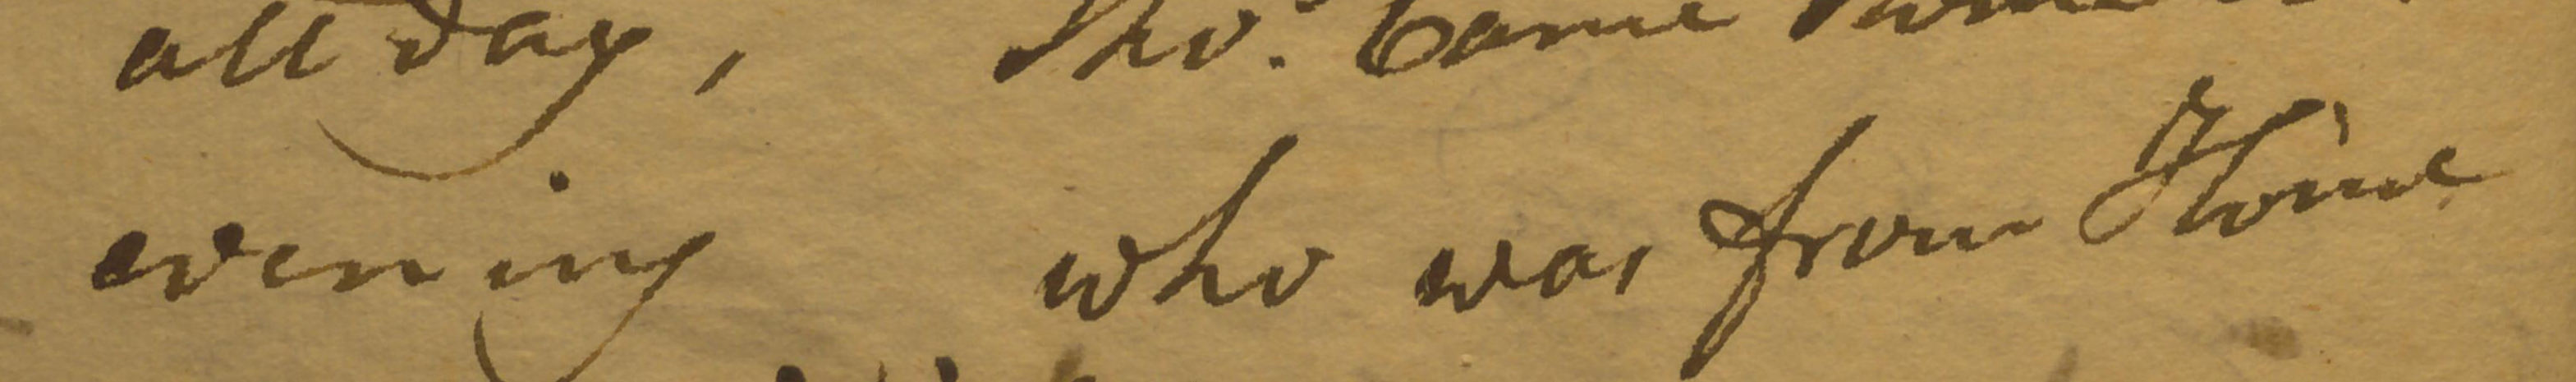evening who was from Home
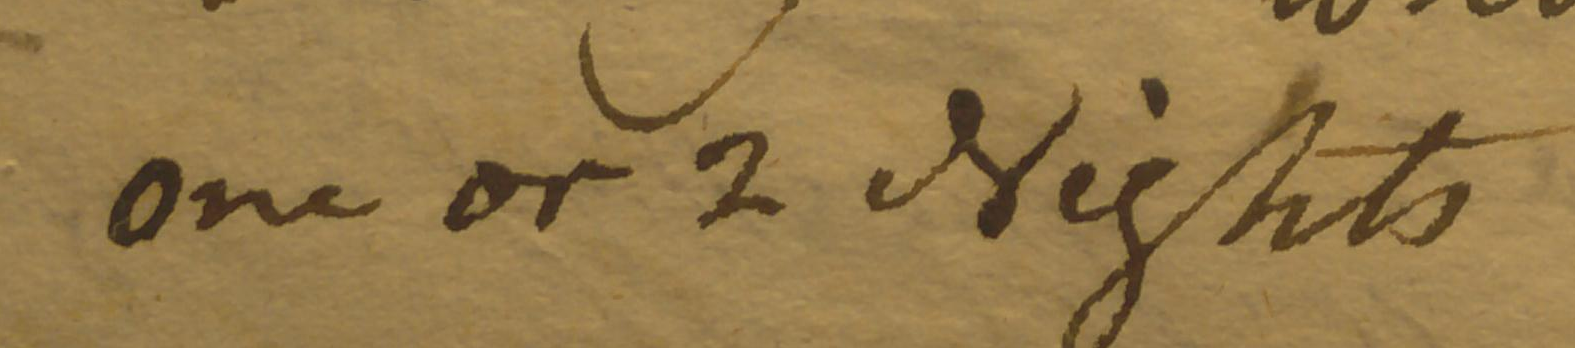one or 2 Nights
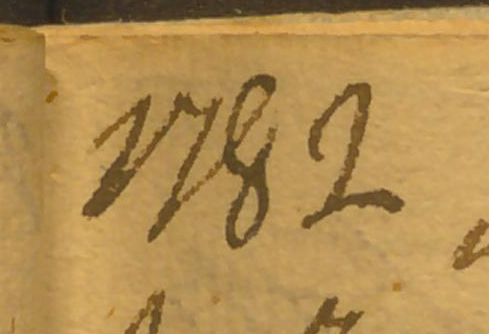1782
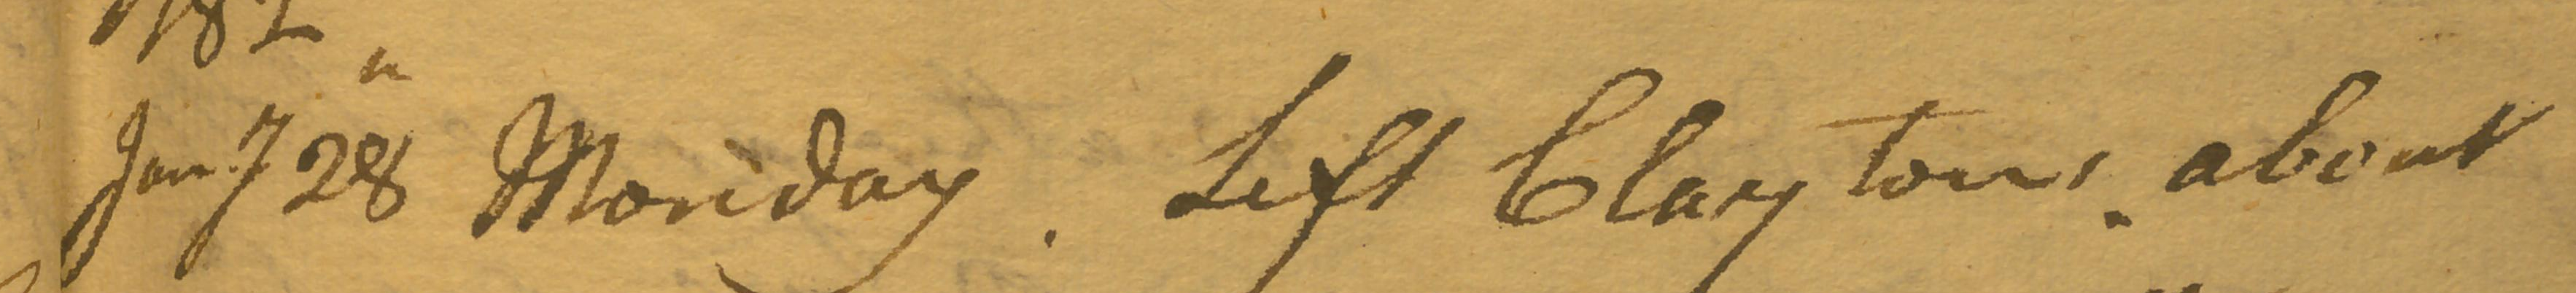Jan^y. 28 Monday, Left Claytons about
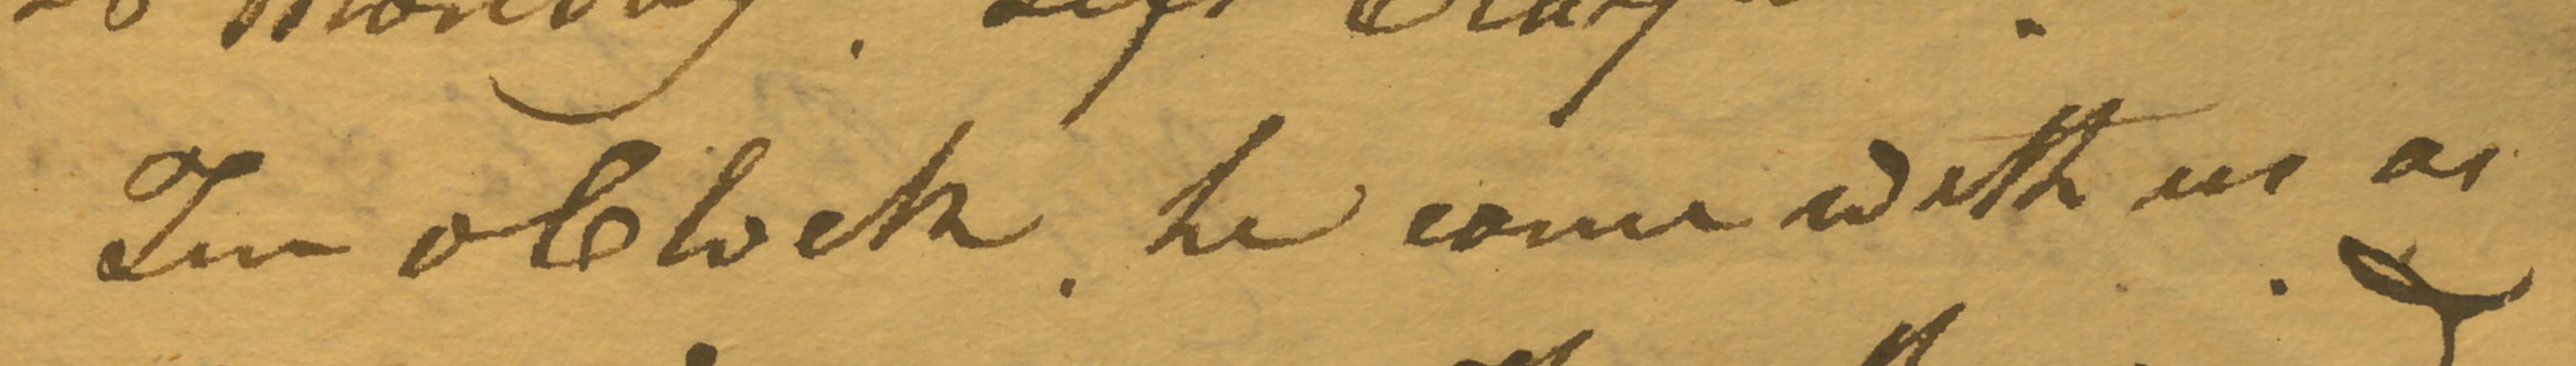Ten oClock he came with us as
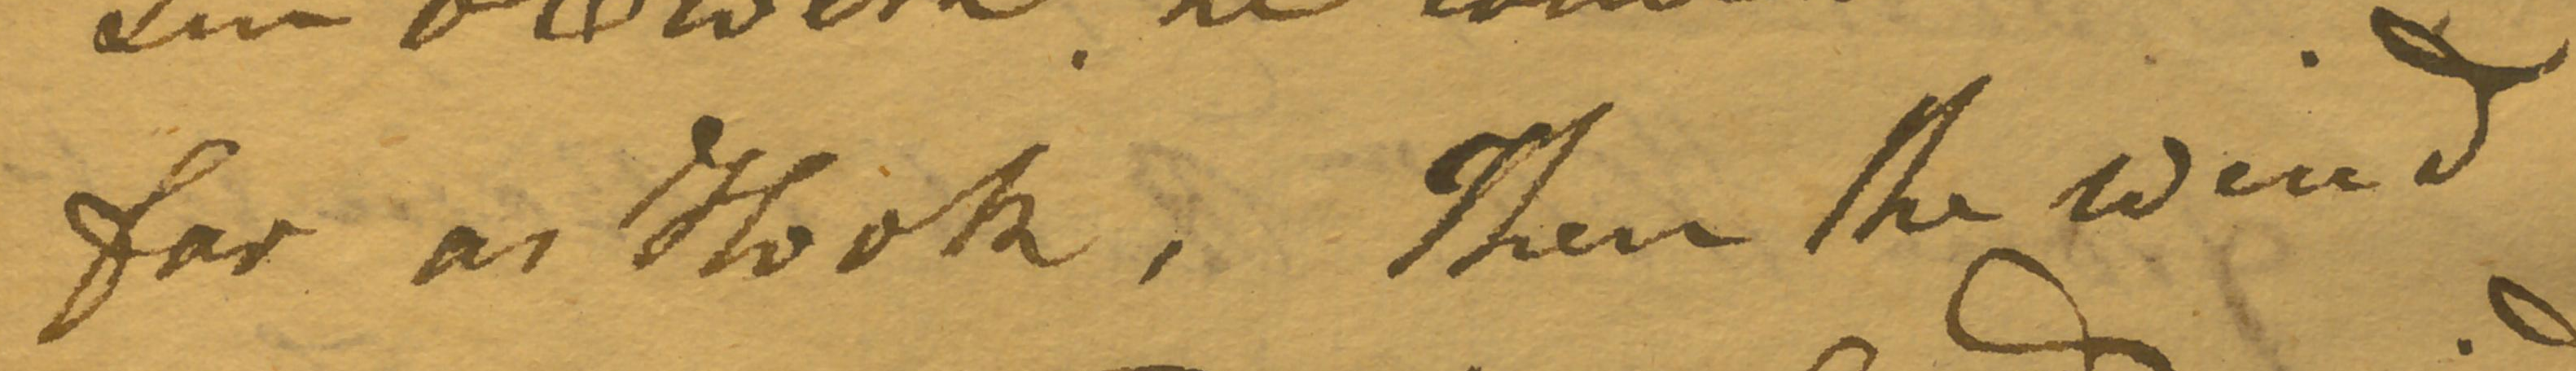far as Hook, Then the wind
